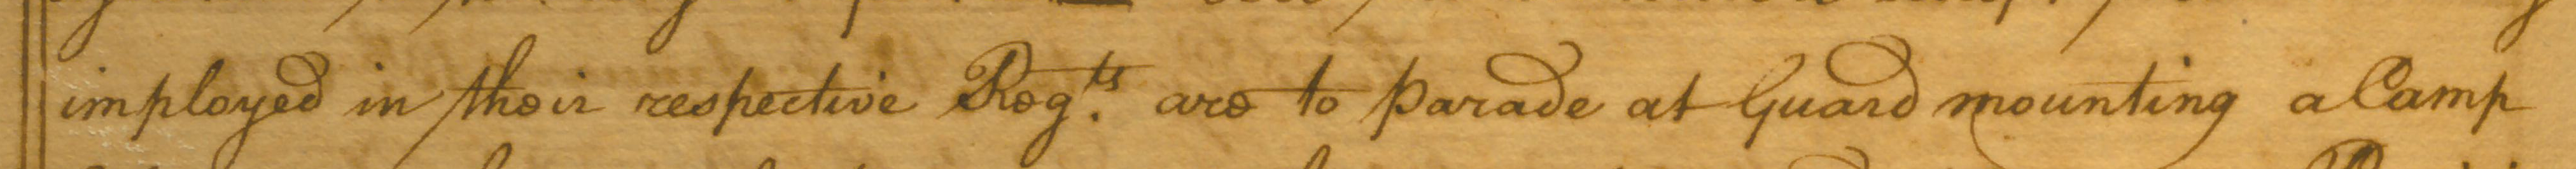imployed in their respective Reg^ts. are to parade at Guard mounting a Camp
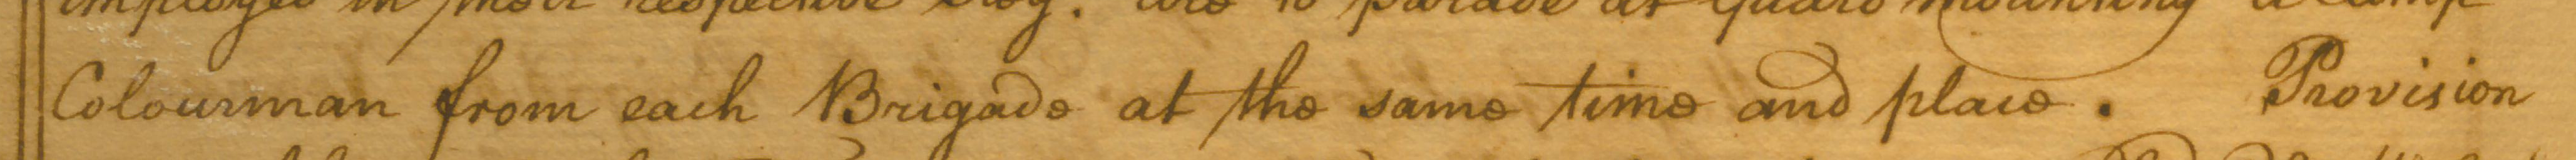Colourman from each Brigade at the same time and place. Provision
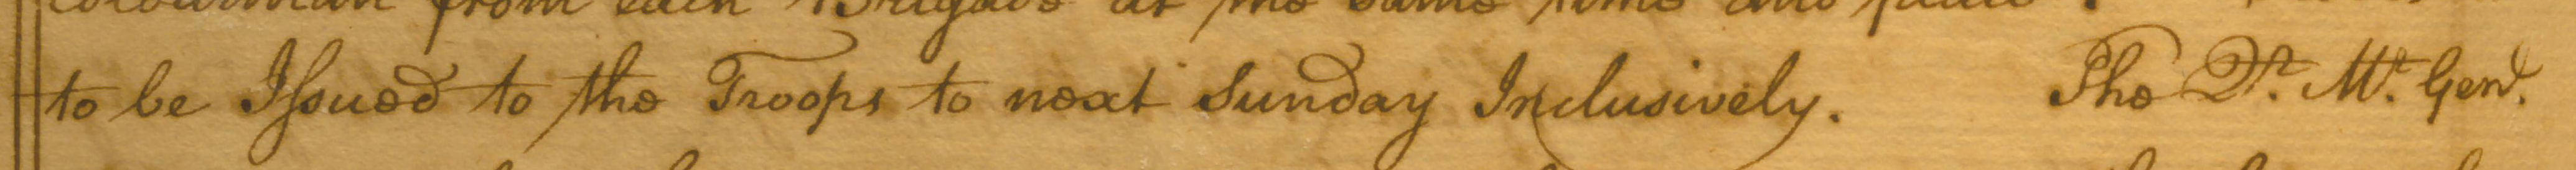to be Issued to the Troops to next Sunday Inclusively. The Q^r. M^r. Gen^l.
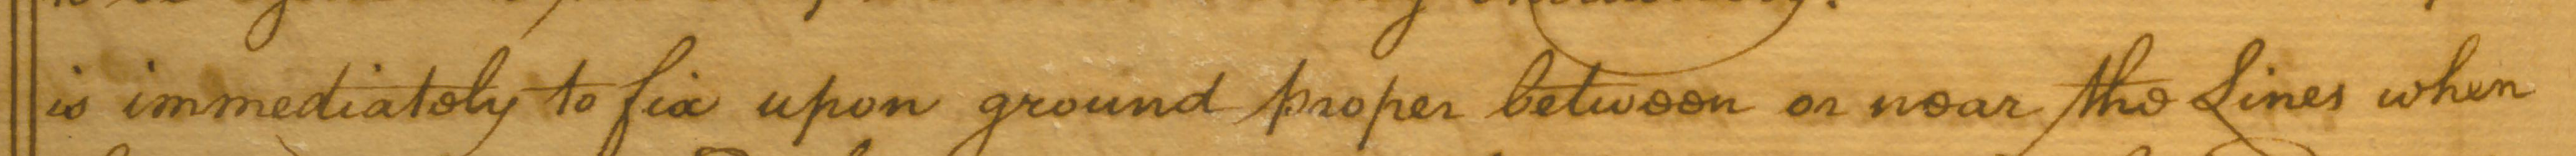is immediately to fix upon ground proper between or near the Lines when
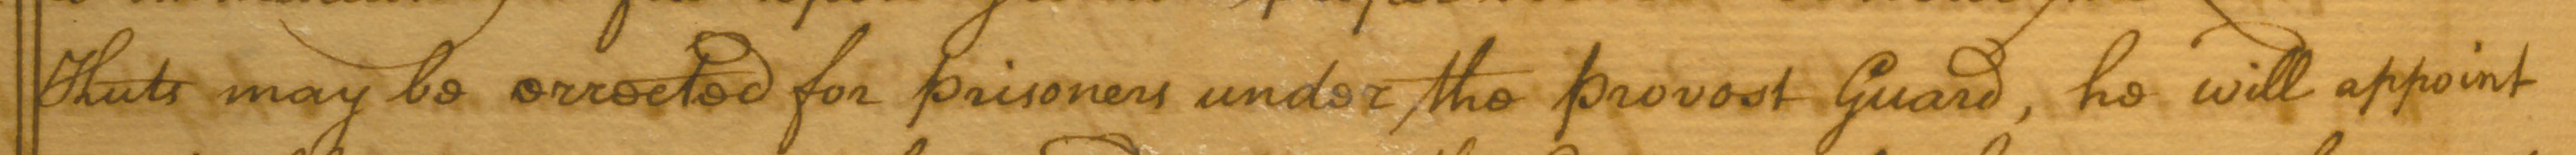Huts may be errected for prisoners under the provost Guard, he will appoint
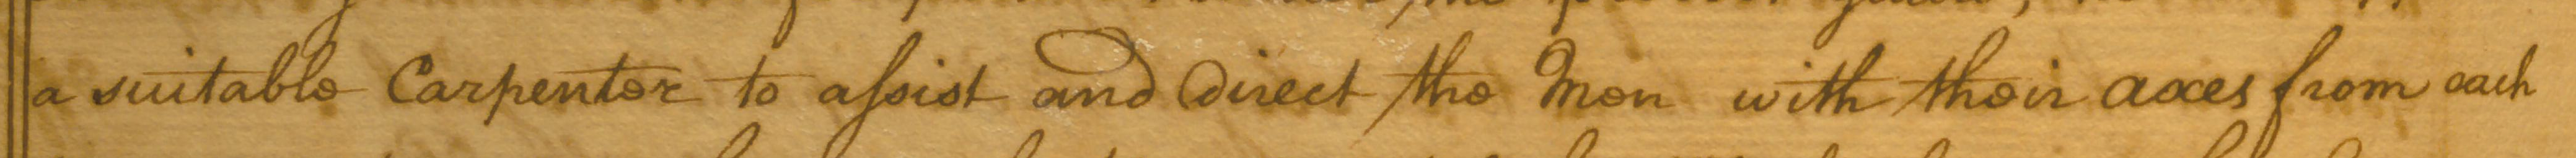a suitable Carpenter to assist and direct the men with their acces from each
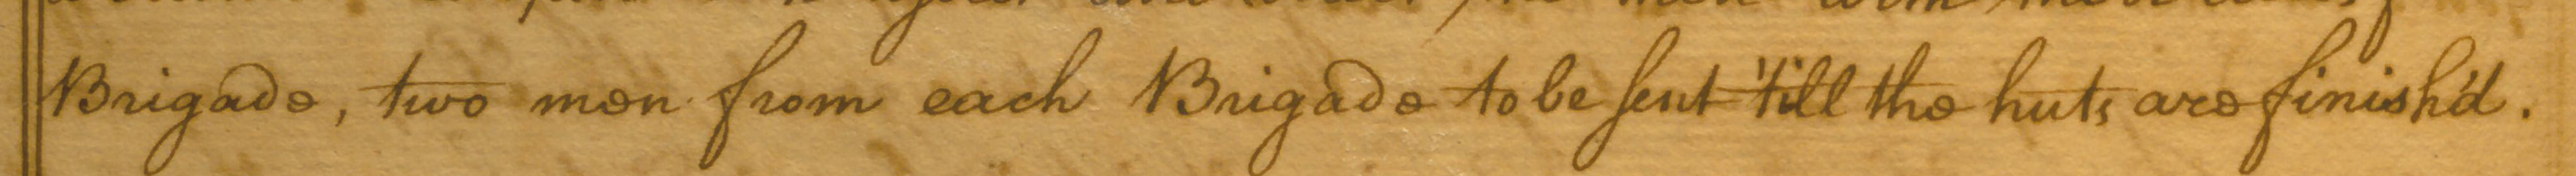Brigade, two men from each Brigade to be sent 'till the huts are finish'd.
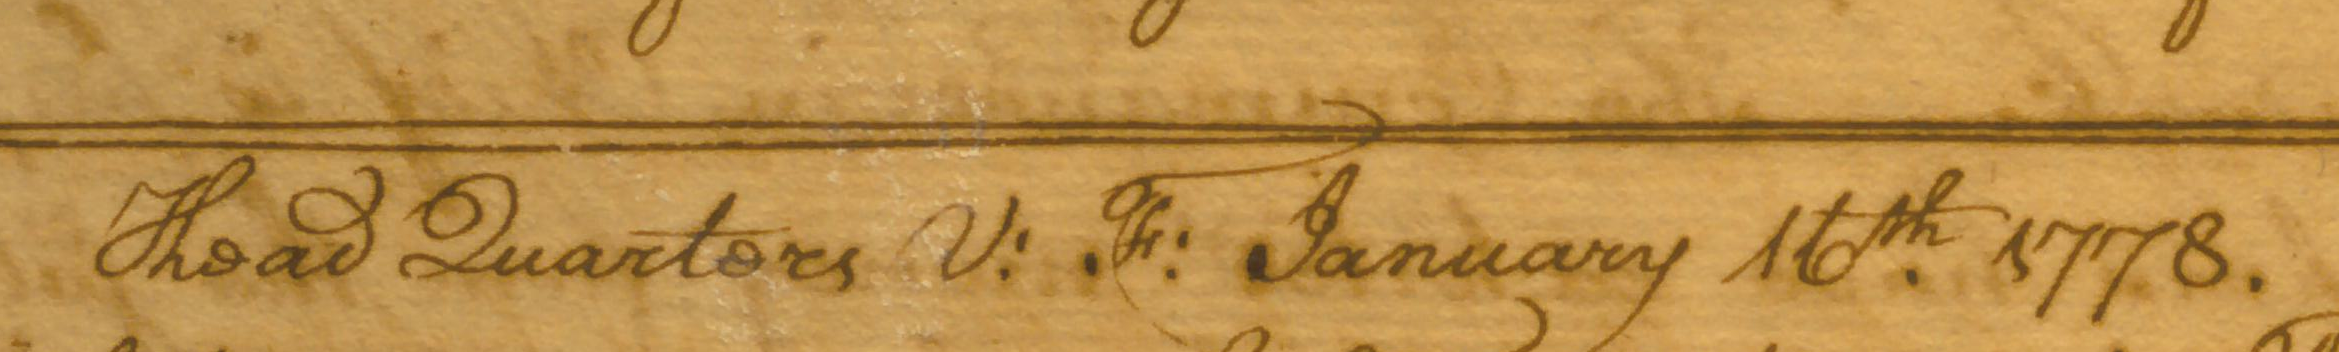Head Quarters V: F: January 16^th. 1778.
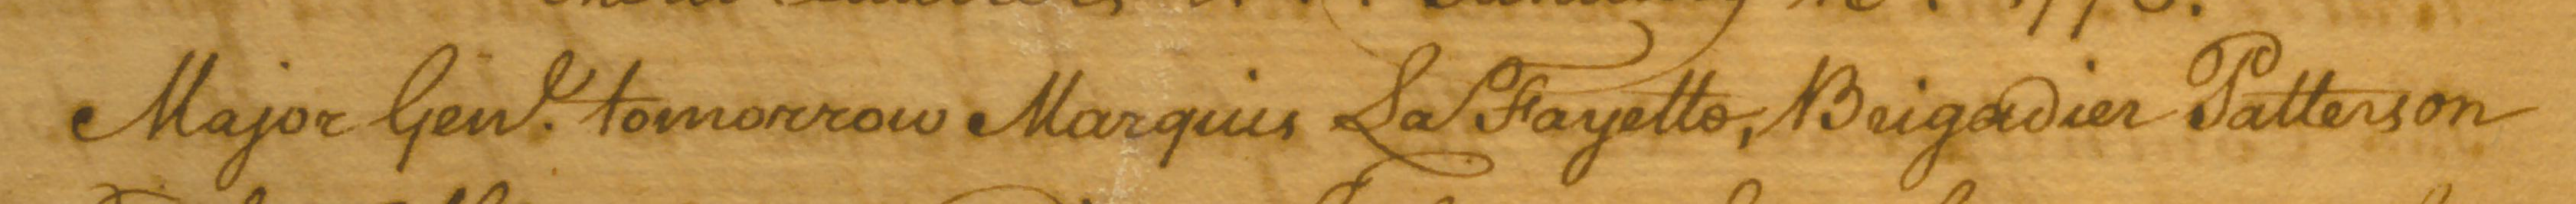Major Gen^l. tomorrow Marquis La Fayette, Brigadier Patterson
